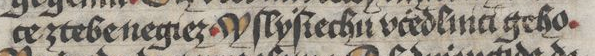ce ztebe negiez.Y ſlyẛiechu vċednici geho.
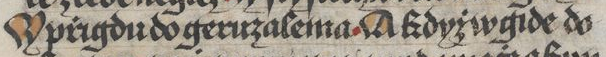Y pṙigdu do geruzalema.A kdyż vgíde do
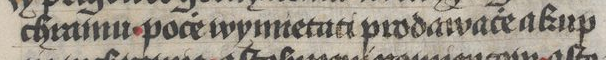chramu poċe wymietati prodawaċe a kup¬
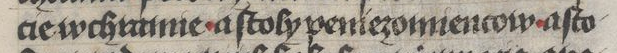cie v chramíe a ſtoly peníezomiemcow a ſto¬
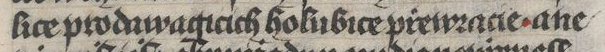lice prodawagicích holubice pṙewracie.ane¬
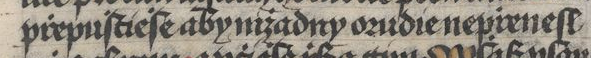pṙepuẛtíeẛe aby niżadny orudíe nepṙeneſl
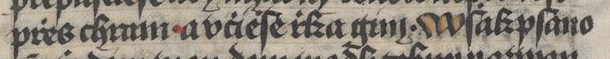pṙes chram.a vċíeẛe ṙka gím.Wẛak pſano
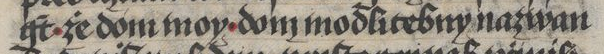ḡt.že dóm moy.dom modlitebny nazwan
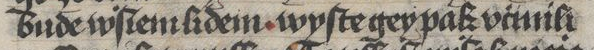bude wẛiem lidem.wyſte gey pak vċinili
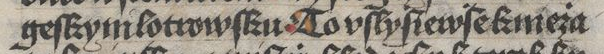geſkyni lotrowſku.To vſlyẛiewẛe knieża¬
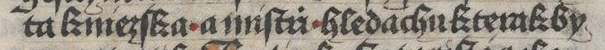ta kniezſka.a miſtṙi.hledachu kterak by
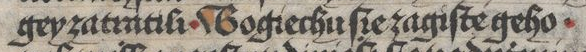gey zatratili.Bogíechu ſie zagiſté geho.
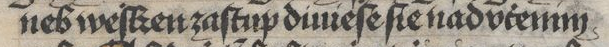neb weẛken zaſtup diuíeſe ſie nad vċením
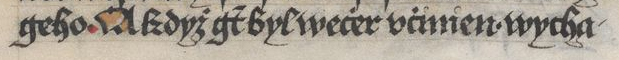geho.A když ḡt byl weċer vċinien.wycha¬
